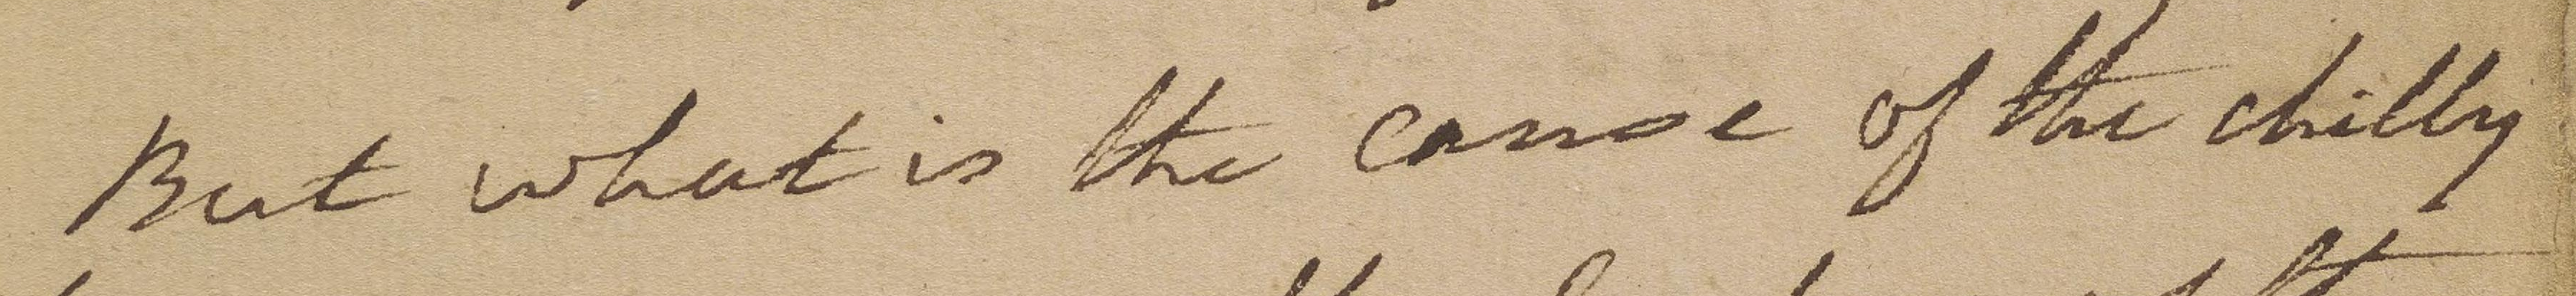But what is the cause of the chilly
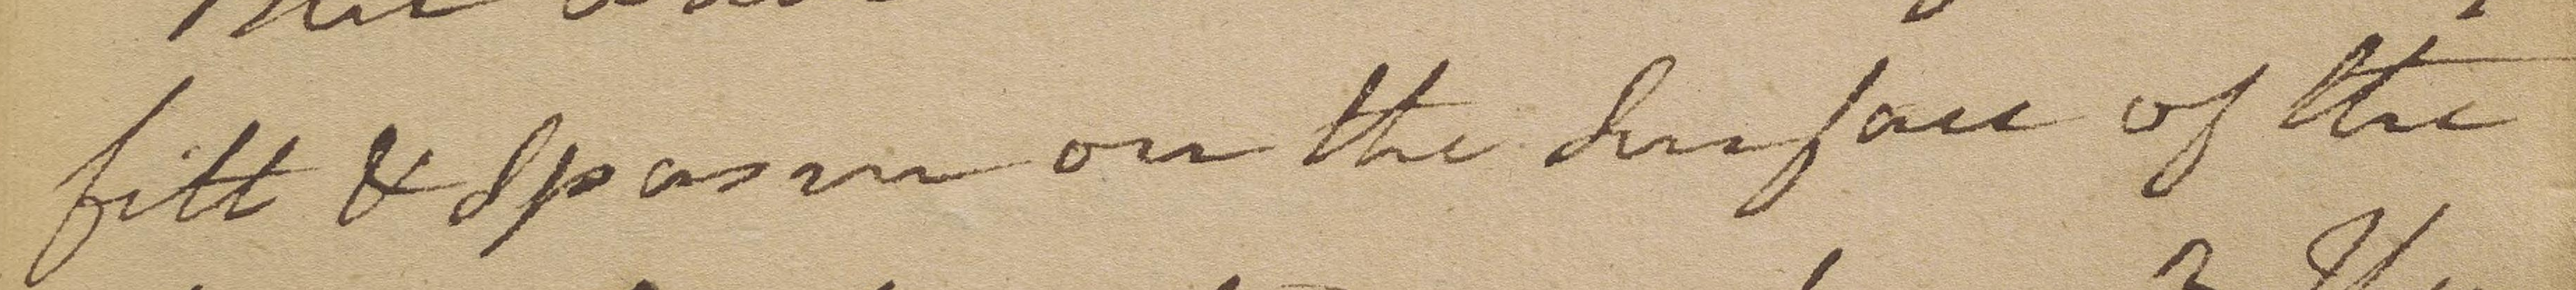fitt & spasm on the surface of the
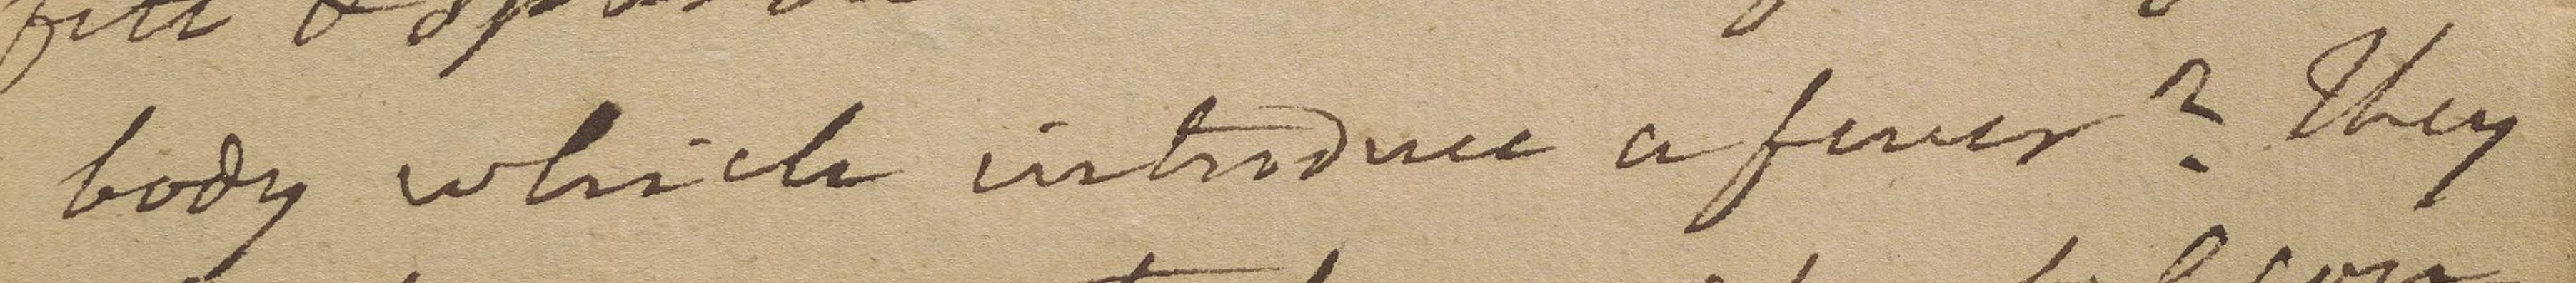body which introduce a fever? They
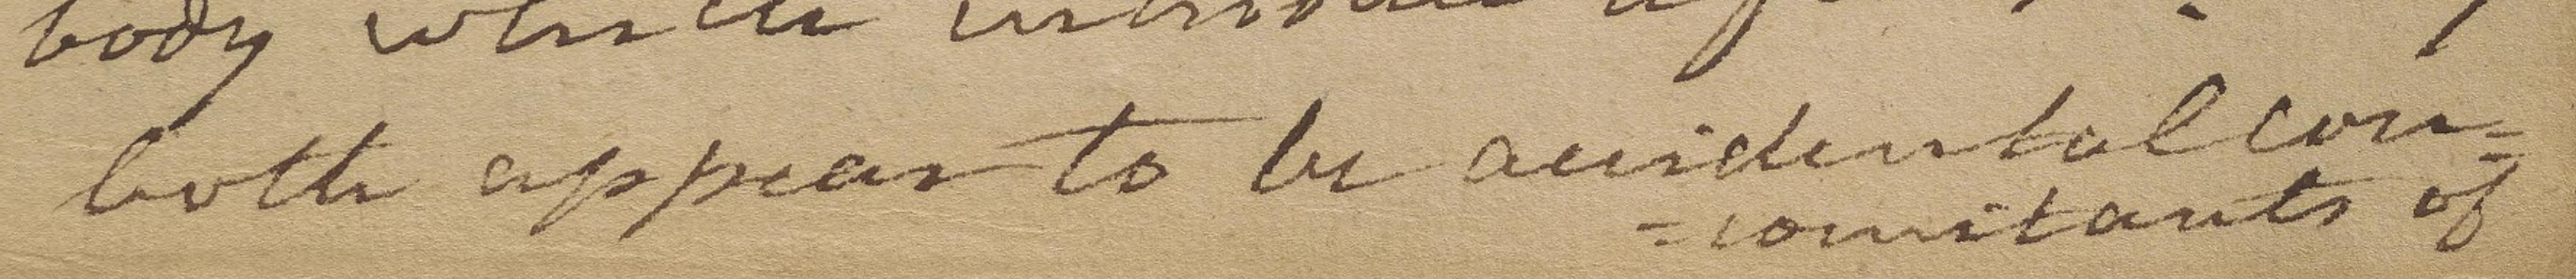both appear to be accidental con-
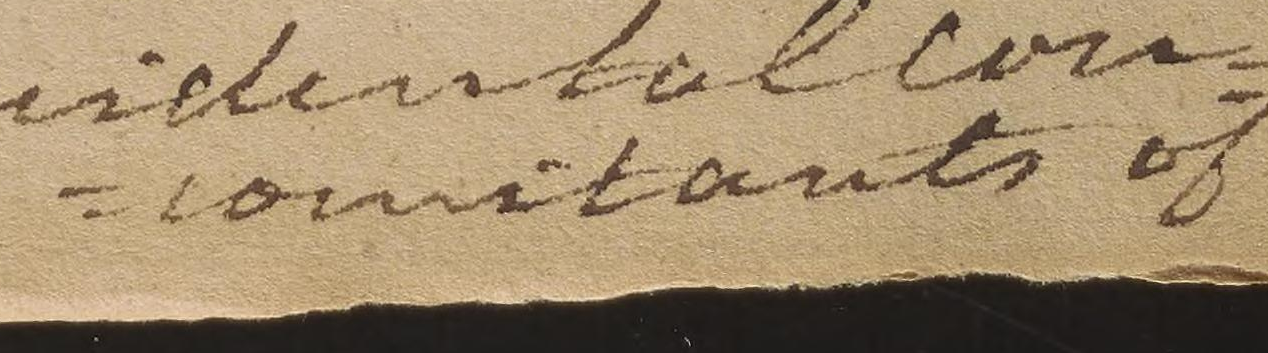-comitants of
